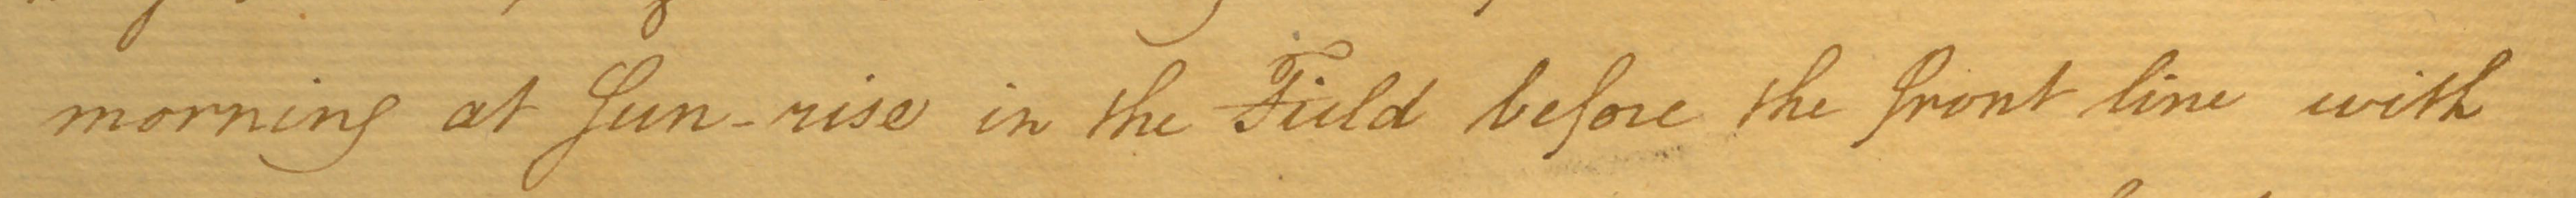morning at Sun-rise in the Field before the front line with
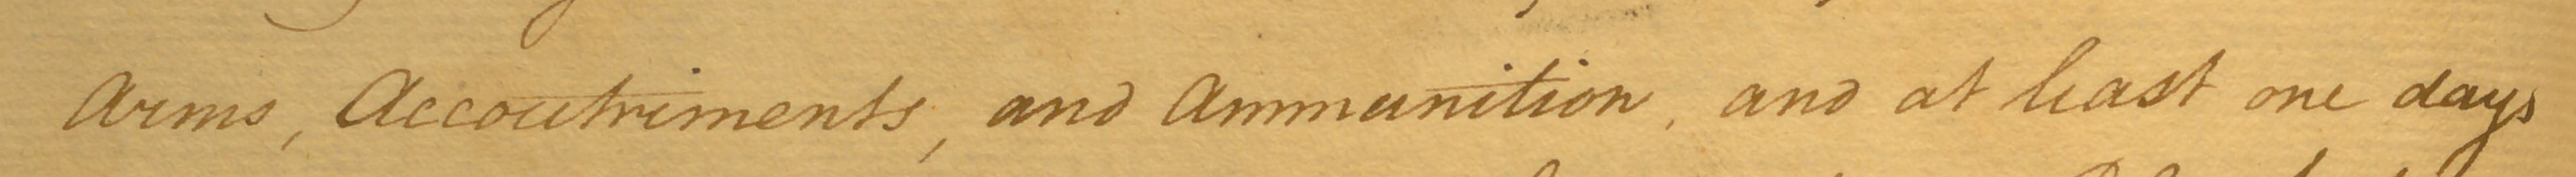Arms, Accoutriments, and Ammunition, and at least one days
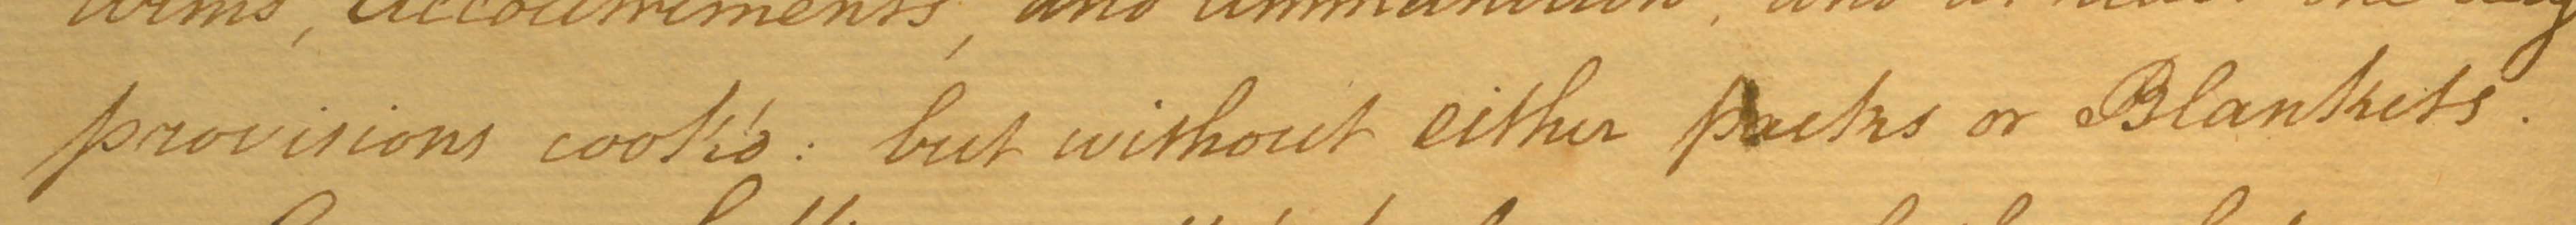provisions cook'd: but without either packs or Blankets.
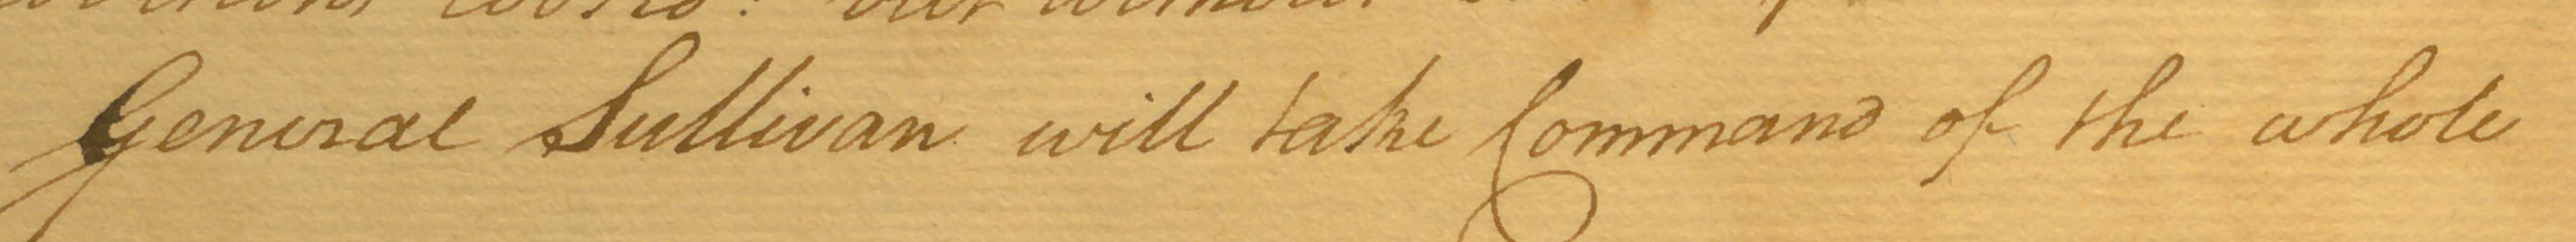General Sullivan will take Command of the whole
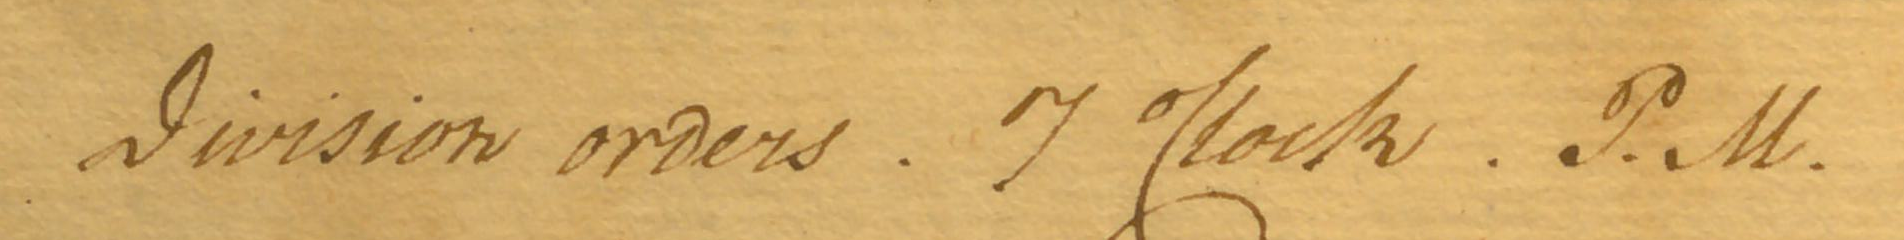Division orders. 7 ^o Clock. P.M.
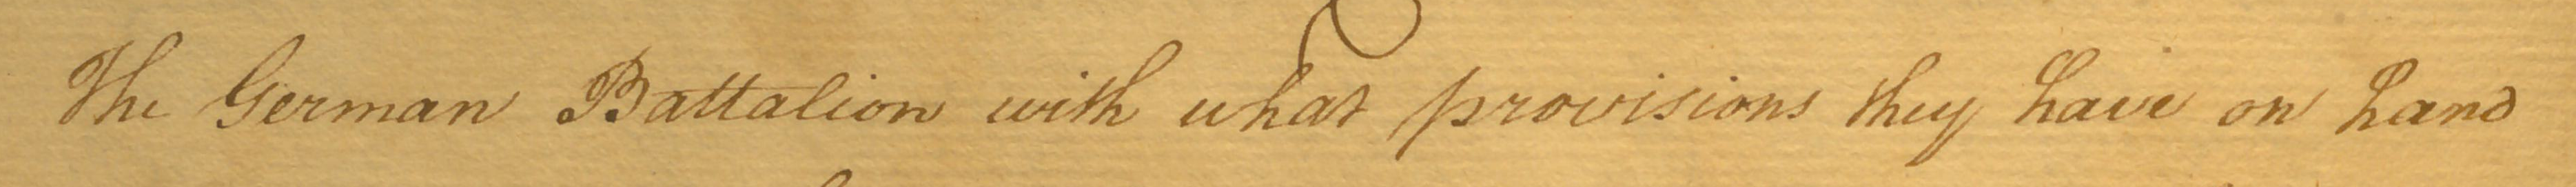The German Battalion with what provisions they have on hand
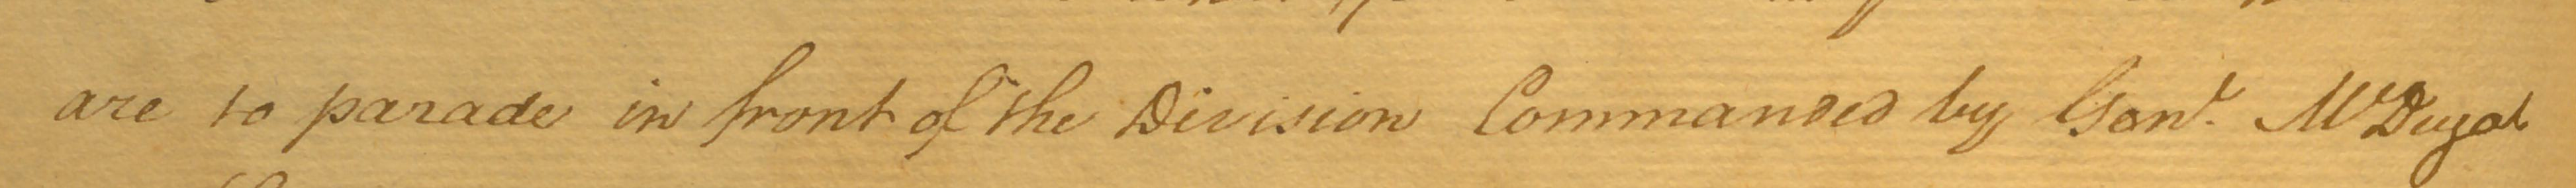are to parade in front of the Division Commanded by Gen^l. M^c Dugal
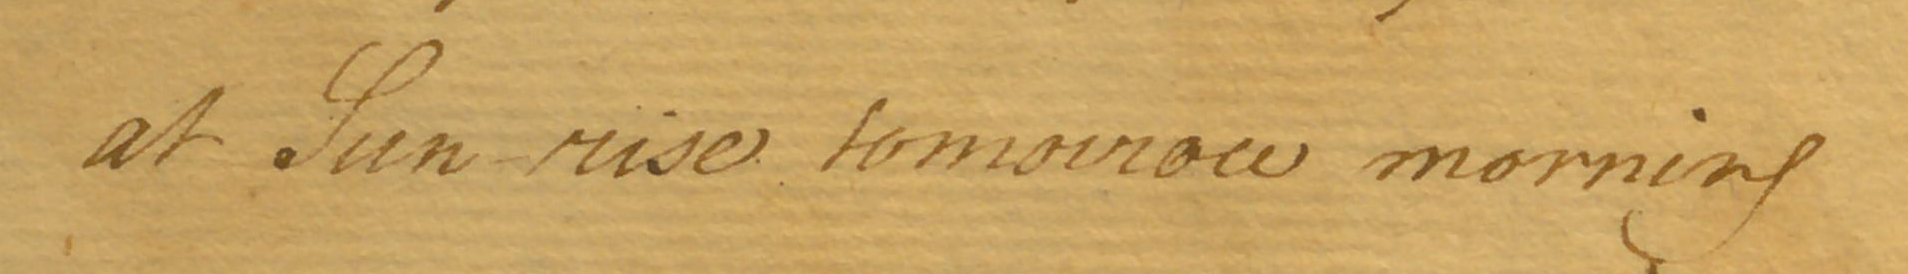at Sun-rise tomorrow morning
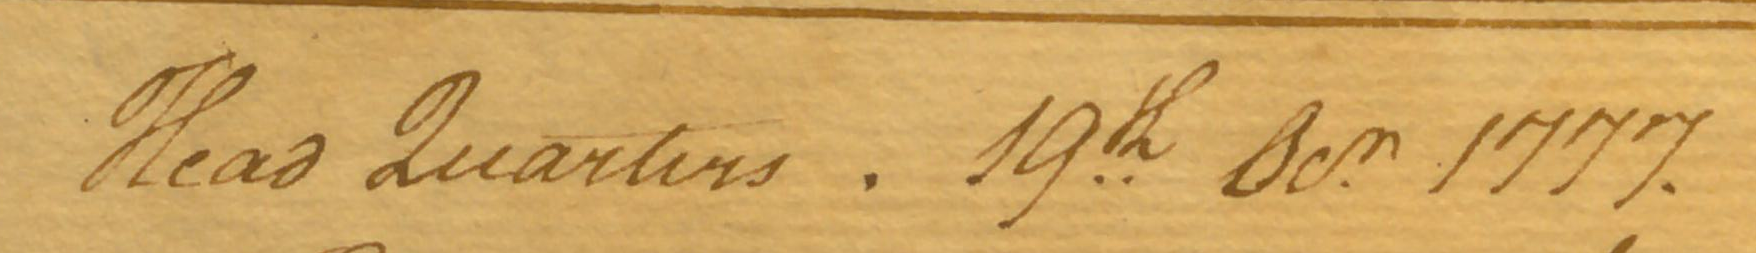Head Quarters. 19^th. Oc^r. 1777.
